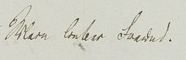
Mein lieber Freund.
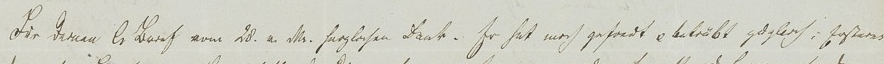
Für deinen l. Brie vom 28. v. Ms. herzlichen Dank. Er hat mich gefreut & betrübt zugleich: Ersteres
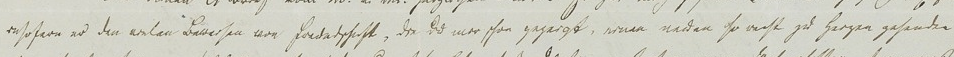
insofern er den vielen Beweisen von Freundschaft, die Du mir schon gezeigt, einen neuen so recht zu Herzen gehenden
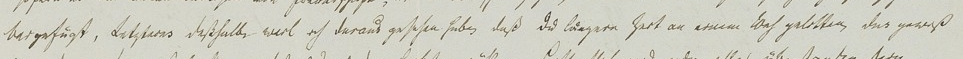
beigefügt, Letzteres deßhalb, weil ich daraus gesehen habe, daß Du längere Zeit an einem Weh gelitten, das gewiß
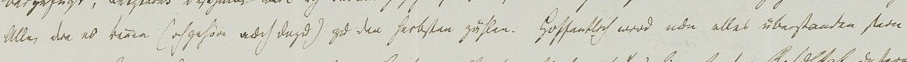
Alle, die es kennen (ich gehöre auch dazu) zu den herbsten zählen. Hoffentlich wird nun alles überstanden sein.
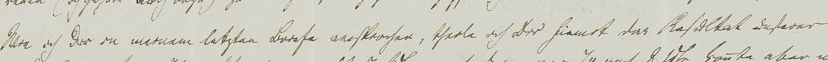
Wie ich Dir in meinem letzten Briefe versprochen, theile ich Dir hiemit das Resultat unserer
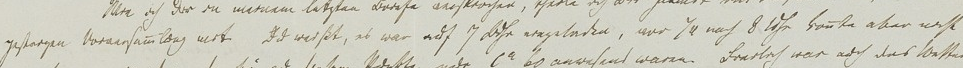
gestrigen Vorversammlung mit. Du weißt, es war auf 7 Uhr eingeladen, vor ¼ nach 8 Uhr konnte aber nicht
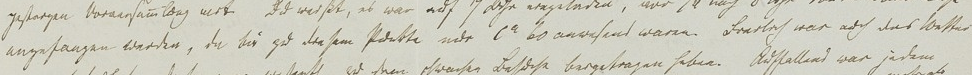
angefangen werden, da bis zu diesem Punkte nur ca 60 anwesend waren. Freilich war auch der Wetter-
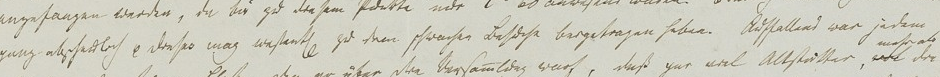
gang abscheulich & dieses mag wesentlich zu dem schwachen Besuche beigetragen haben. Auffallend war jedem
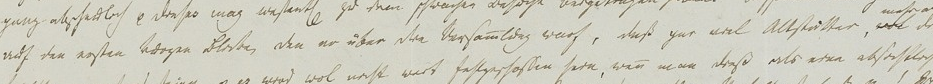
auf den ersten kurzen Blicke, den er über die Versammlung warf, daß gar viel Altstätter, mehr als die
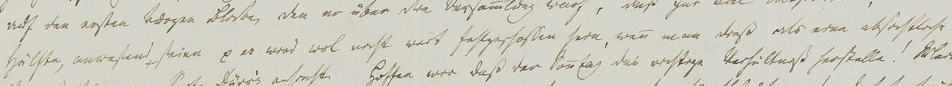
Hälfte, anwesend seien & es wird wol nicht weit fehlgeschossen sein, wenn man dieß als eine absichtliche
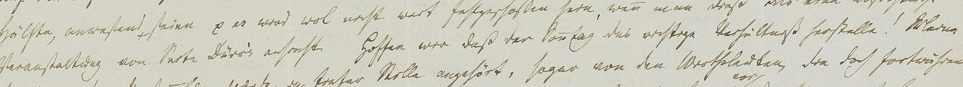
Veranstaltung von Seite Dürr's ansieht. Hoffen wir daß der Sonntag das richtige Verhältniß herstelle! Meine
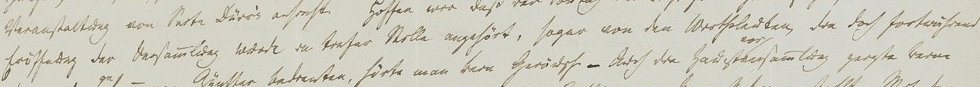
Eröffnung der Versammlung wurde in tiefer Stille angehört, sogar von den Wirthsleuten, die doch fortwährend
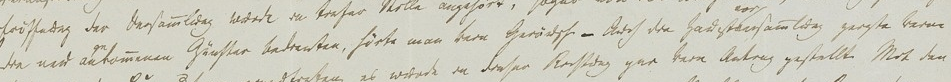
die neu angekommenen Zünfter bedienten, hörte man kein Geräusch. – Auch die Hauptvorversammlung zeigte keine
